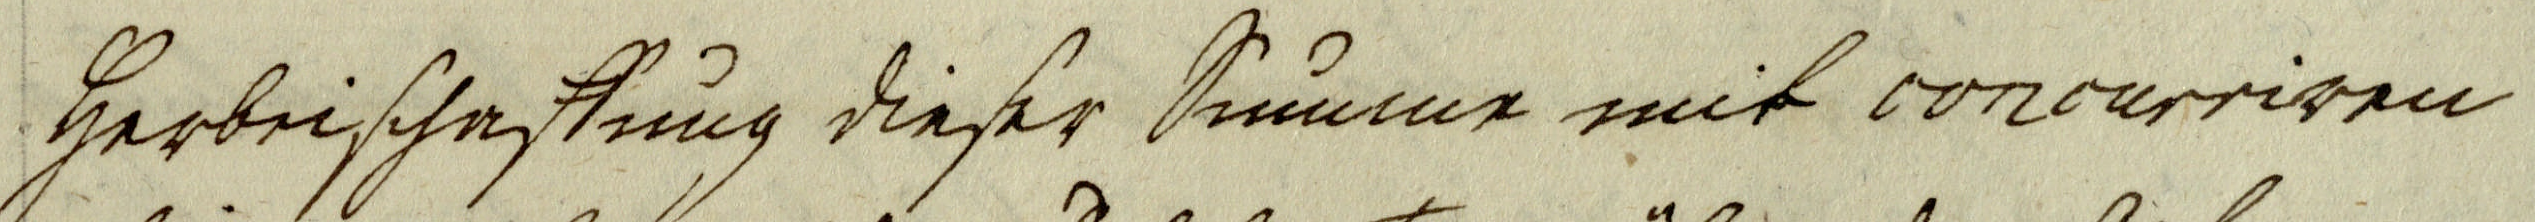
Herbeischaffung dieser Summe mit concurriren
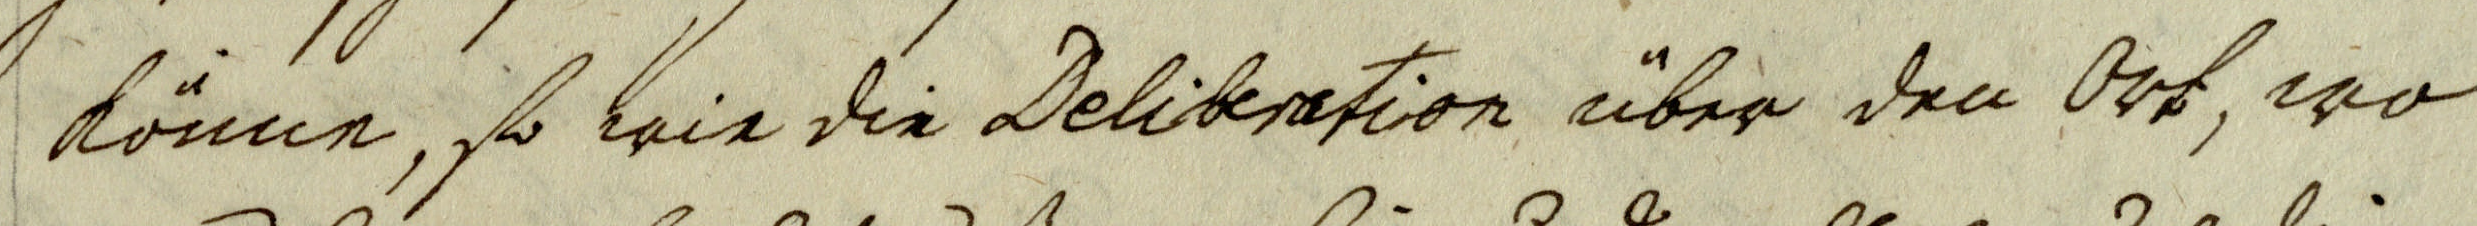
könne, so wie die Deliberation über den Ort, wo
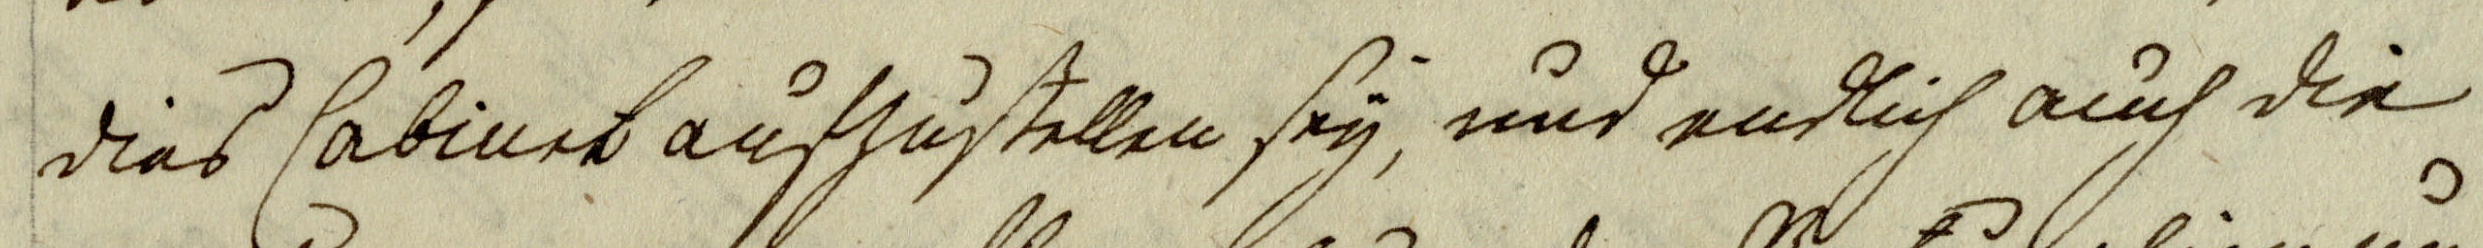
dies Cabinet aufzustellen seÿ, und endlich auch die
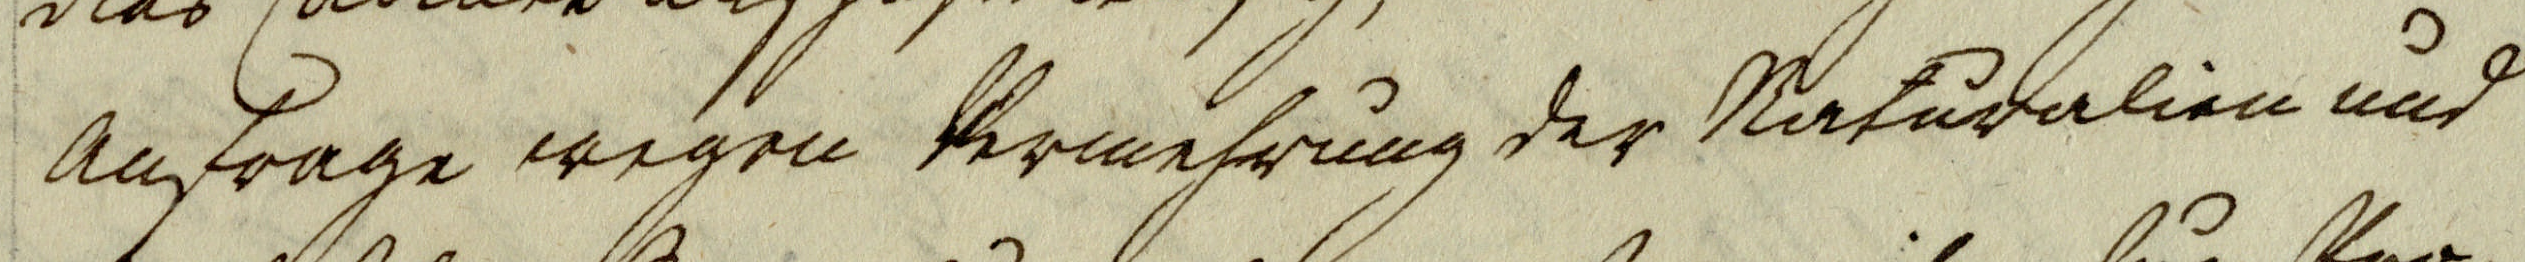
Anfrage wegen Vermehrung der Naturalien und
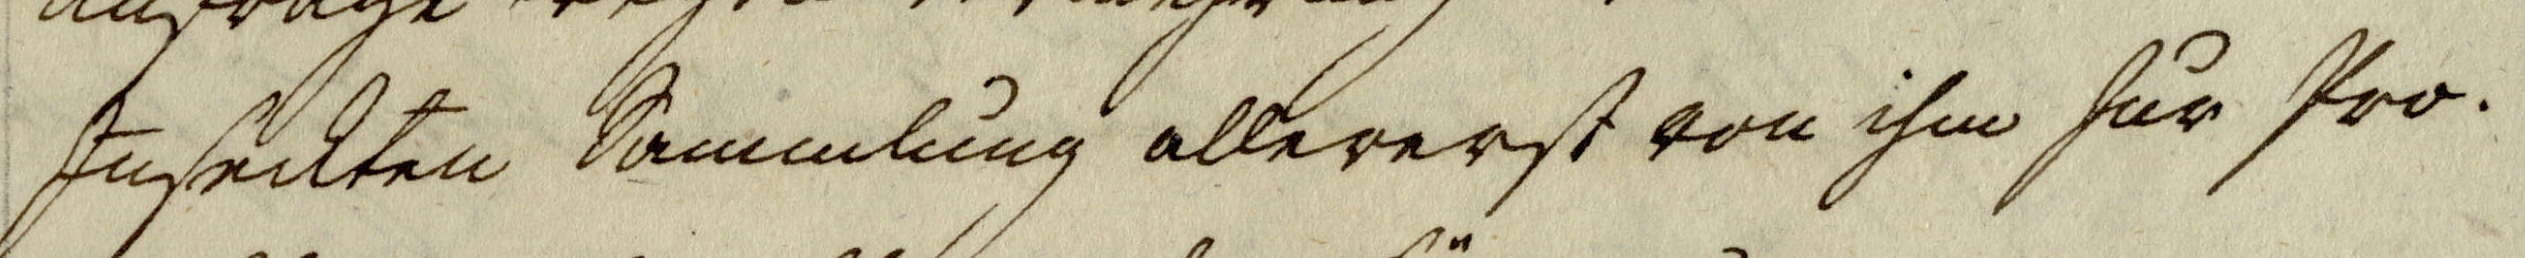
Inseckten Sammlung allererst von ihm zur Pro¬
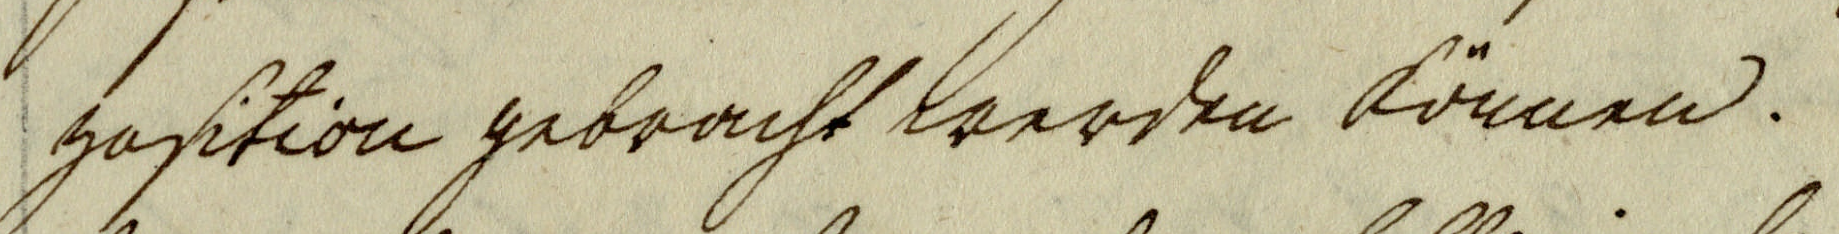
position gebracht werden können.
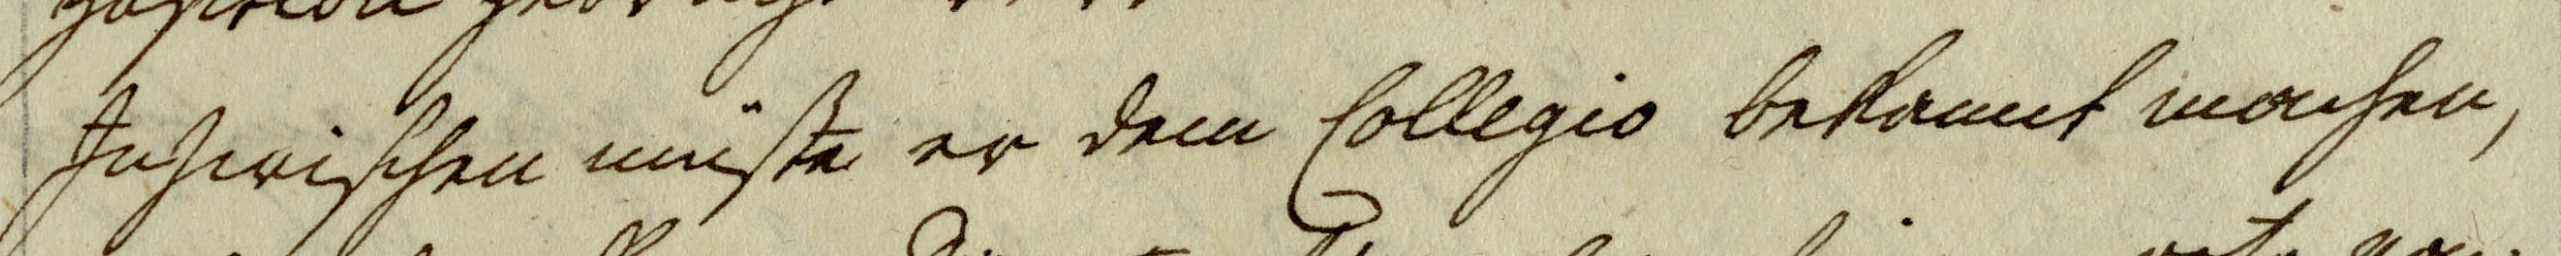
Inzwischen müsste er dem Collegio bekannt machen,
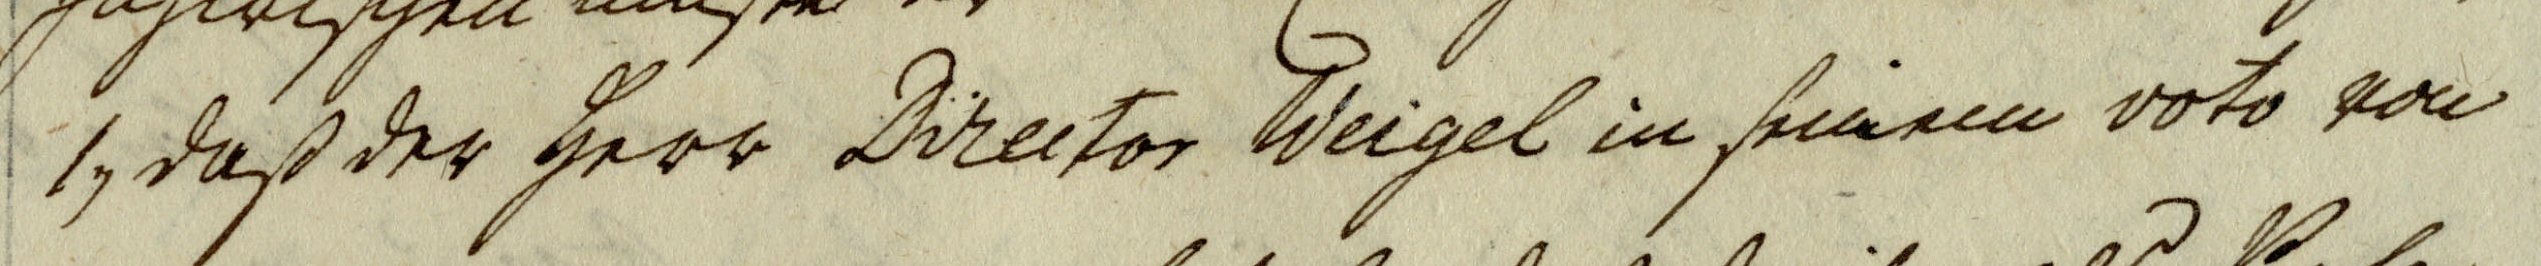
1., daß der Herr Director Weigel in seinem voto von
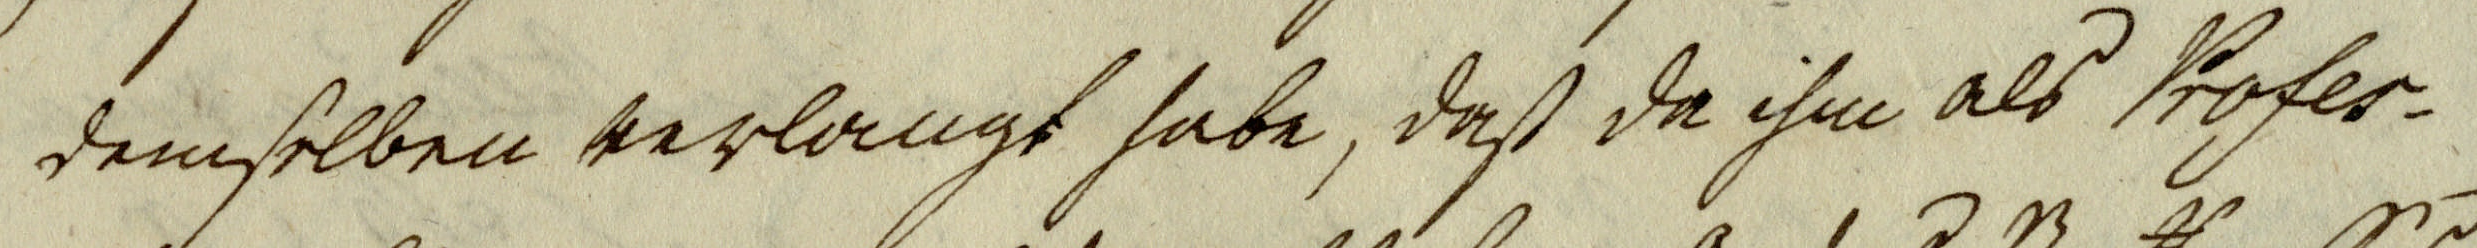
demselben verlangt habe, daß da ihm als Profes¬
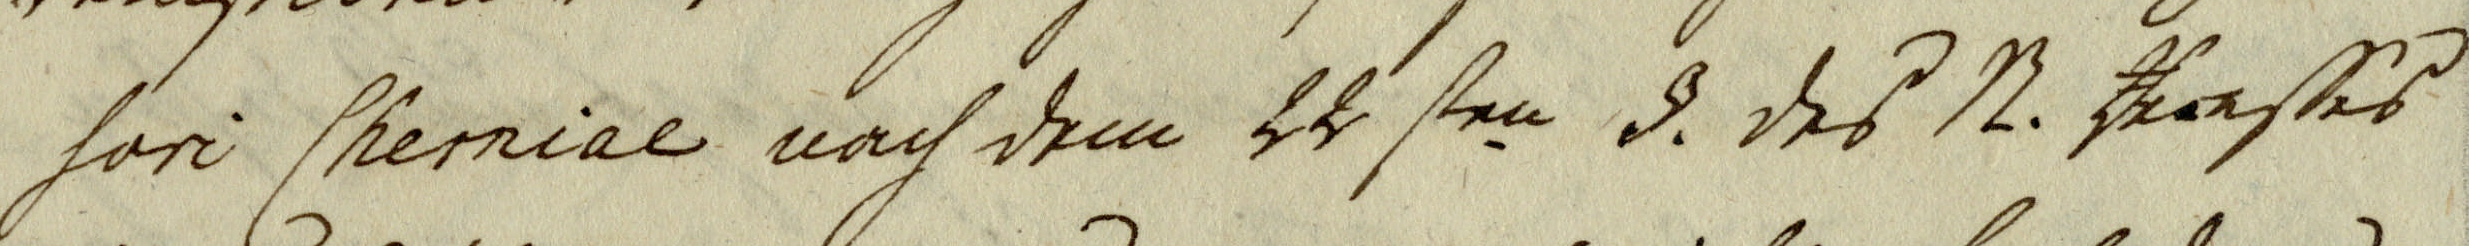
sori Chemiae nach dem 22 sten §. des N. Recesses
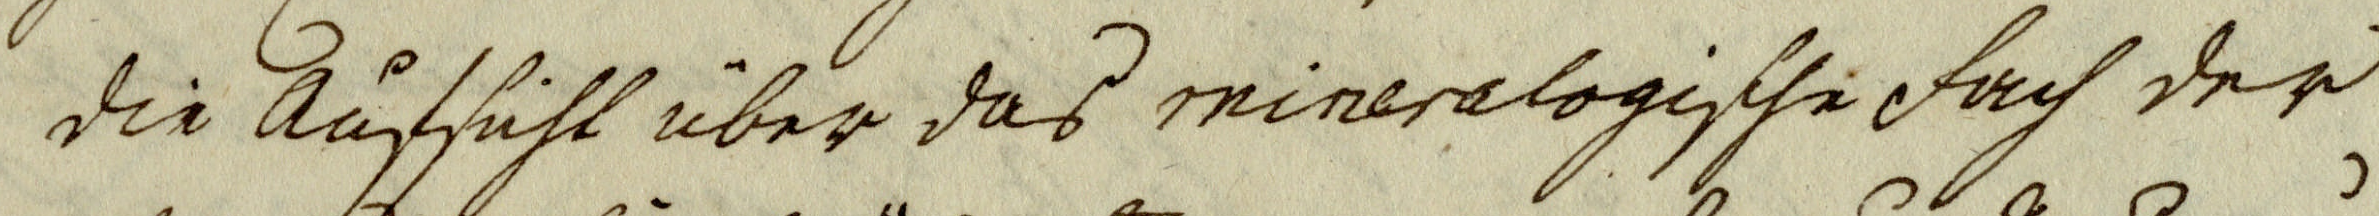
die Aufsicht über das mineralogische Fach der
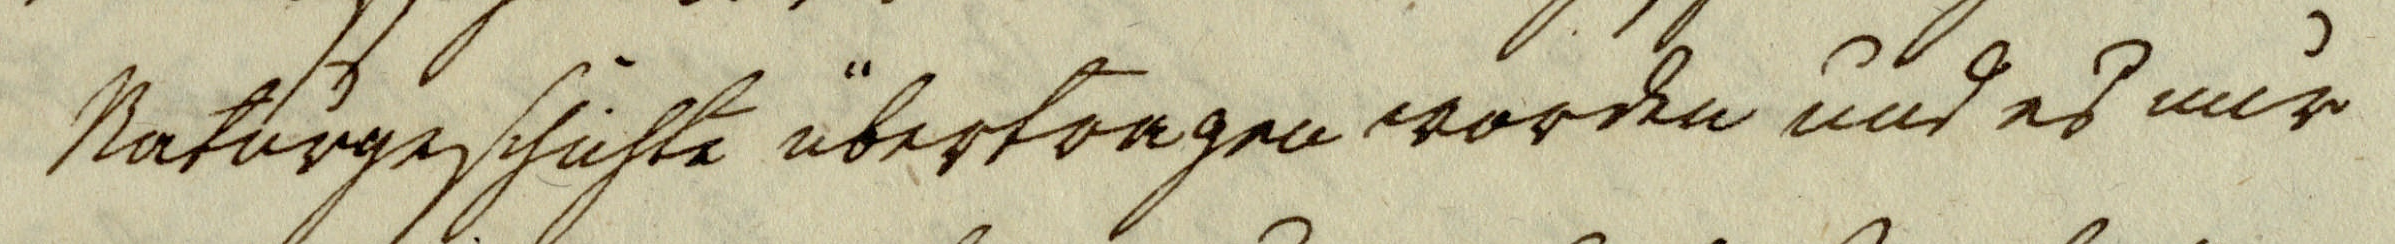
Naturgeschichte übertragen worden und es nur
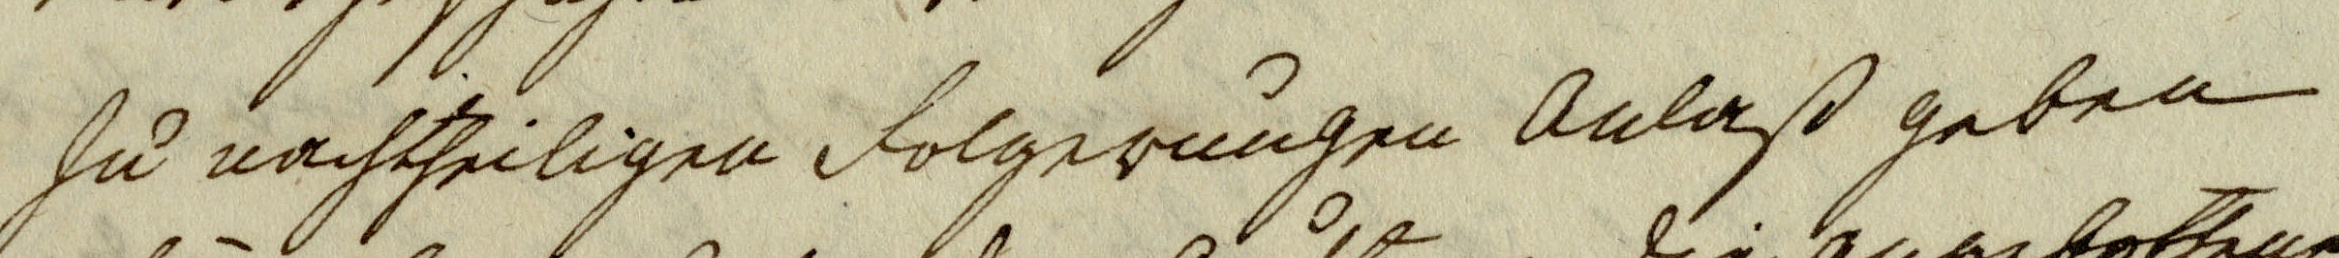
zu nachtheiligen Folgerungen Anlaß geben
